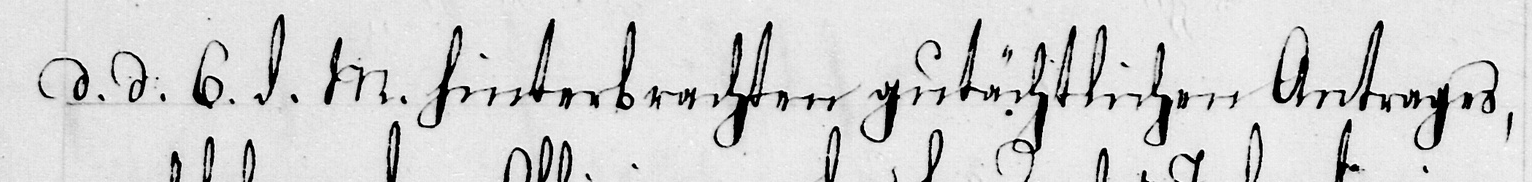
d. d. 6. d. M. hinterbrachten gutächtlichen Antrages,
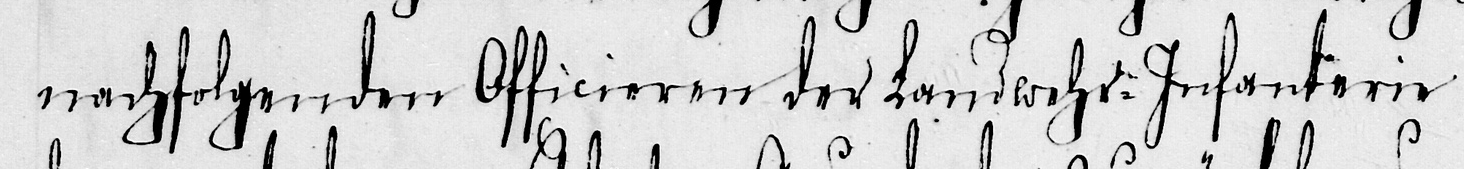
nachfolgenden Officieren der Landwehr-Infanterie
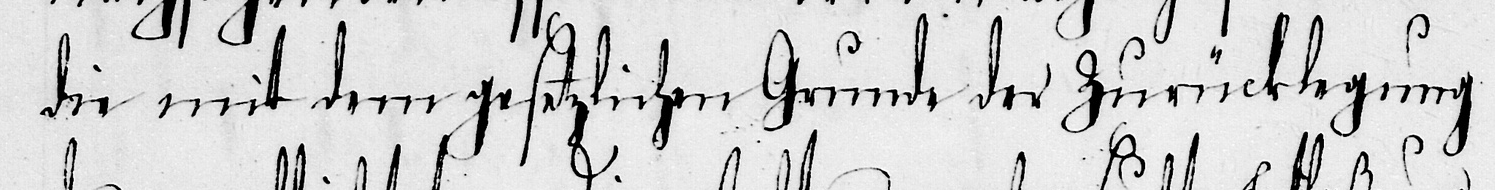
die mit dem gesetzlichen Grunde der Zurücklegung
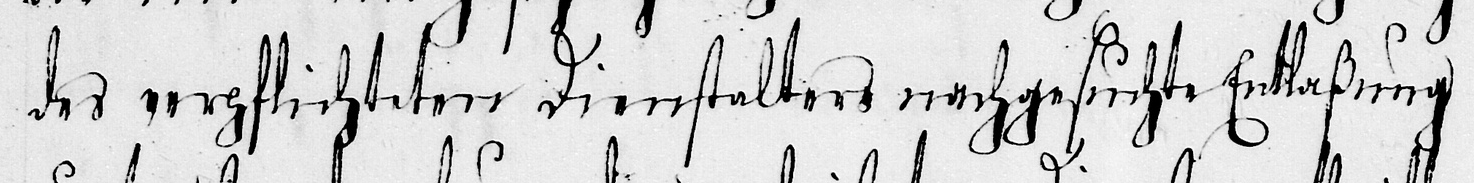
des verpflichteten Dienstalters nachgesuchte Entlaßung
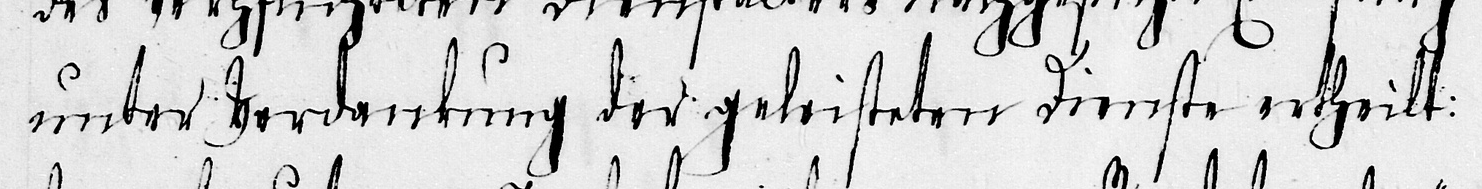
unter Verdankung der geleisteten Dienste ertheilt:
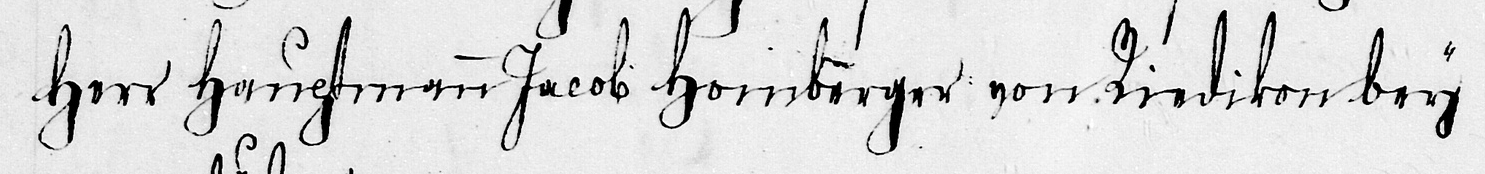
Herr Hauptmann Jacob Homberger von Riedikon bey
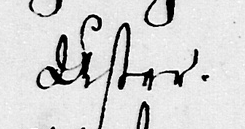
Uster.
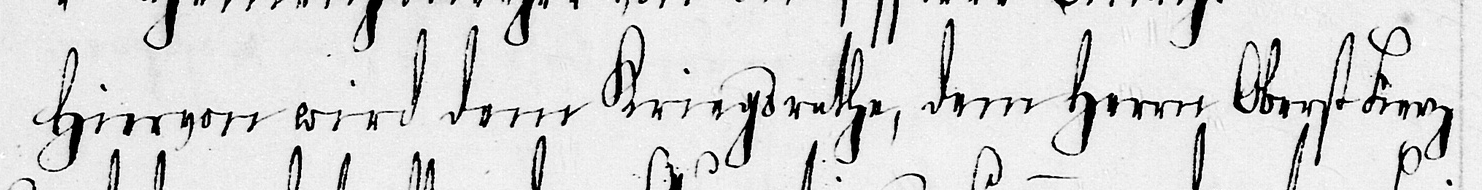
Hiervon wird dem Kriegsrathe, dem Herrn Oberst Fie¬
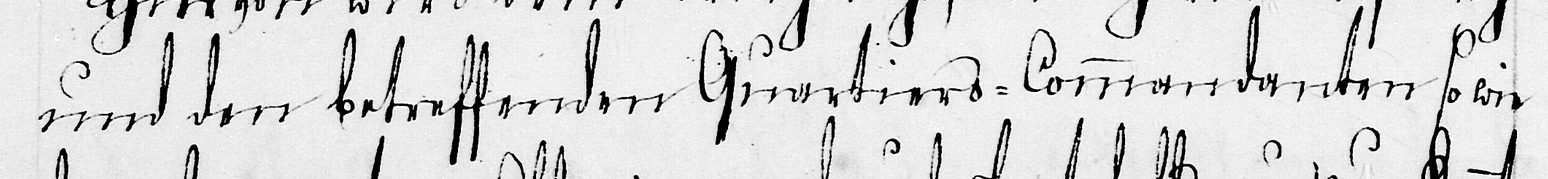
und den betreffenden Quartiers-Commandanten sowie
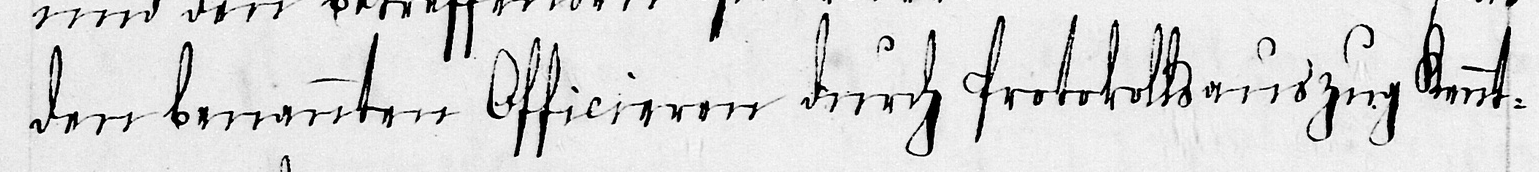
den benannten Officieren durch Protokollsauszug Kenn¬
